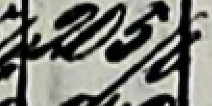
205/?
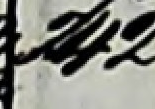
242
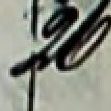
26
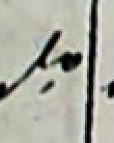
Do
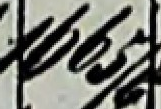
1665/b
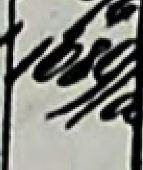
1689/a
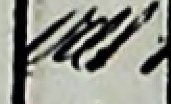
Alt
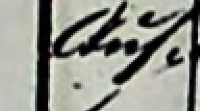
Aus„
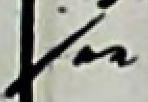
see
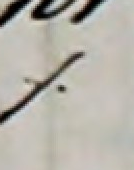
./.
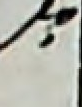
Do
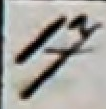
17
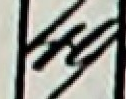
49
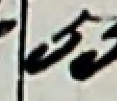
55
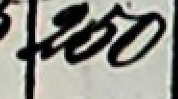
250
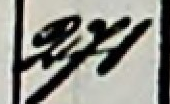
271
